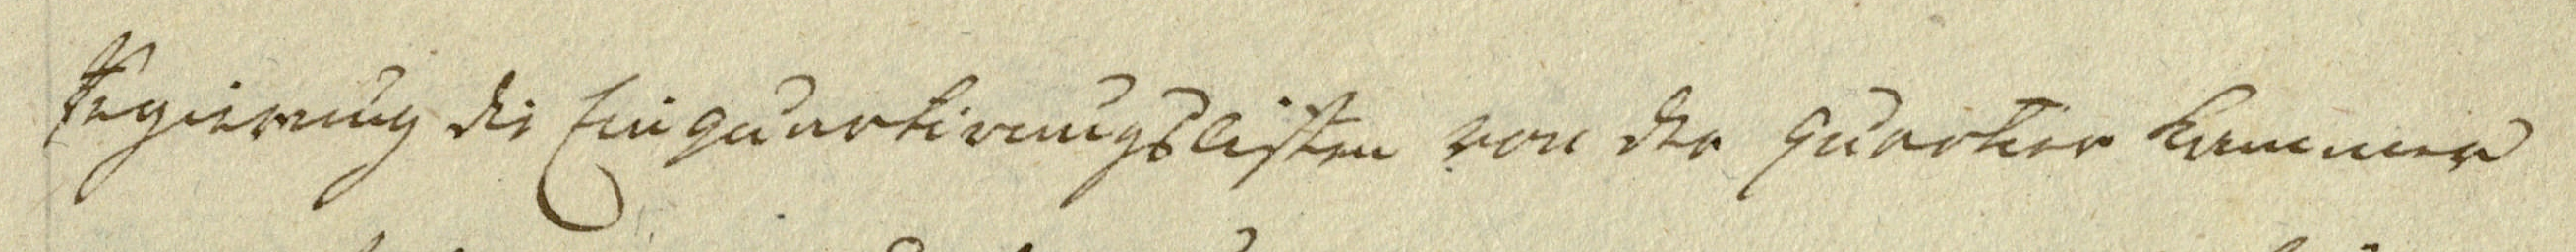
Regierung die Einquartirungslisten von der Quartier kammer
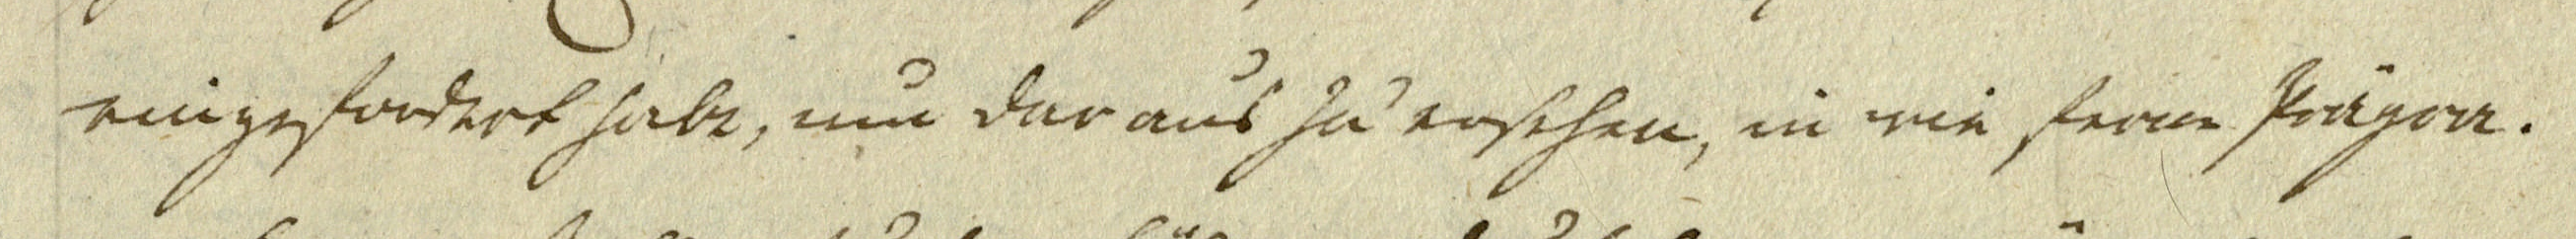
eingefordert habe, um daraus zu ersehen, in wie ferne Präpra¬
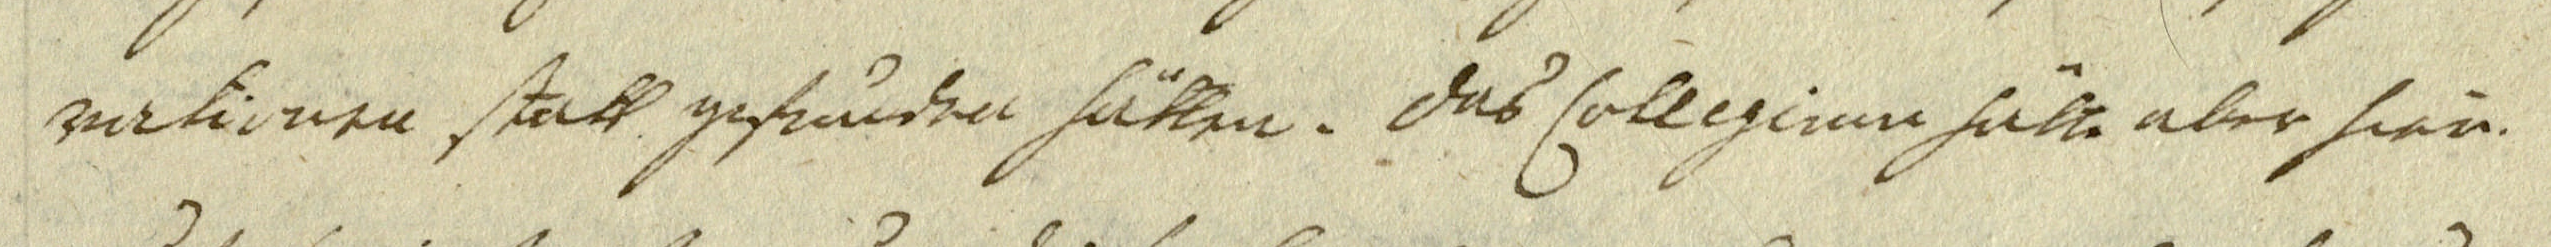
rationen statt gefunden hätten. Das Collegium hätte aber hier¬
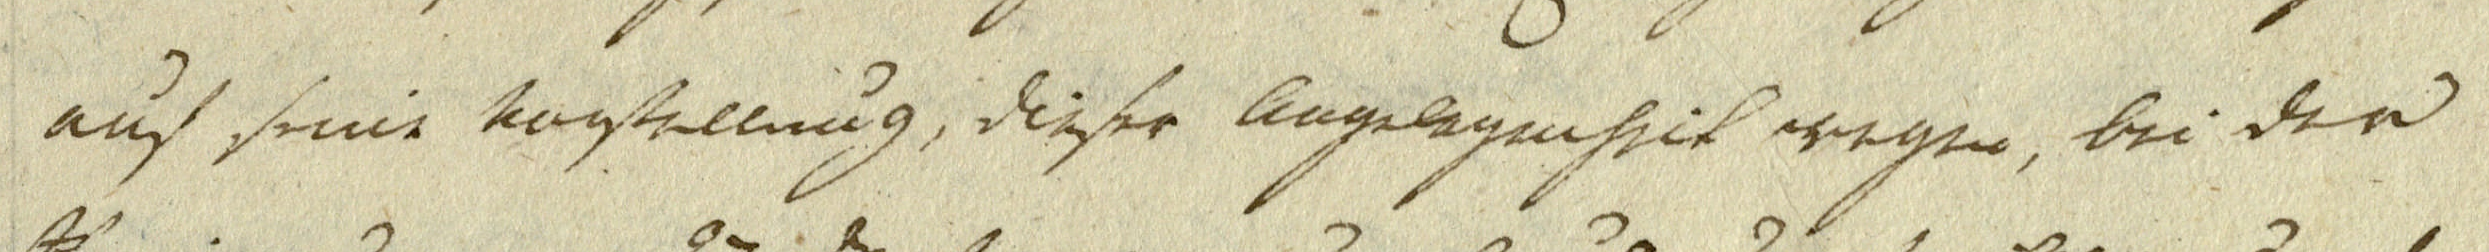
auf seine Vorstellung, dieser Angelegenheit wegen, bei der
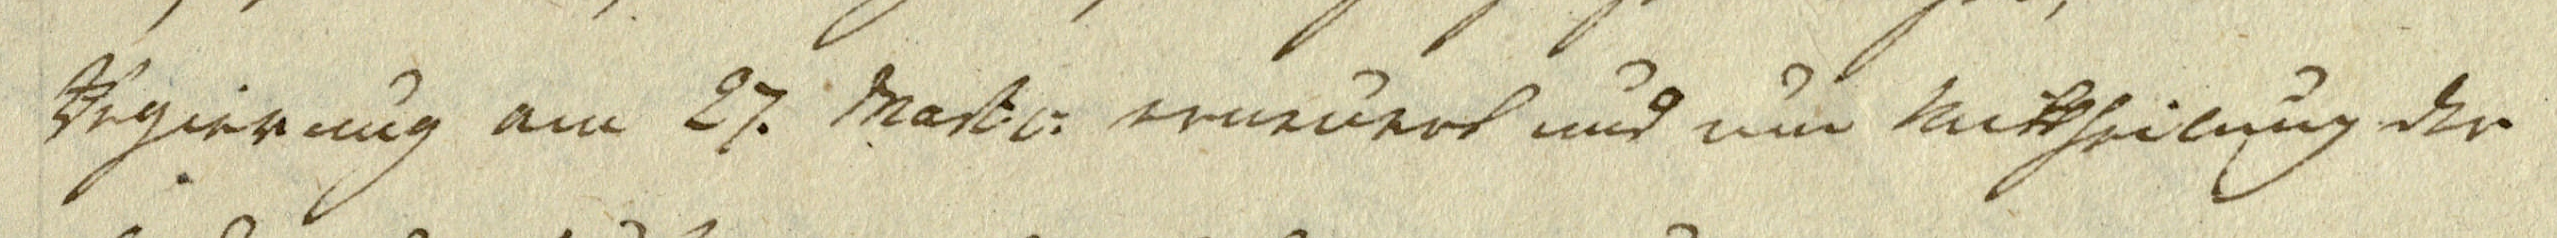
Regierung am 27. Mart c. erneuert und um Mittheilung der
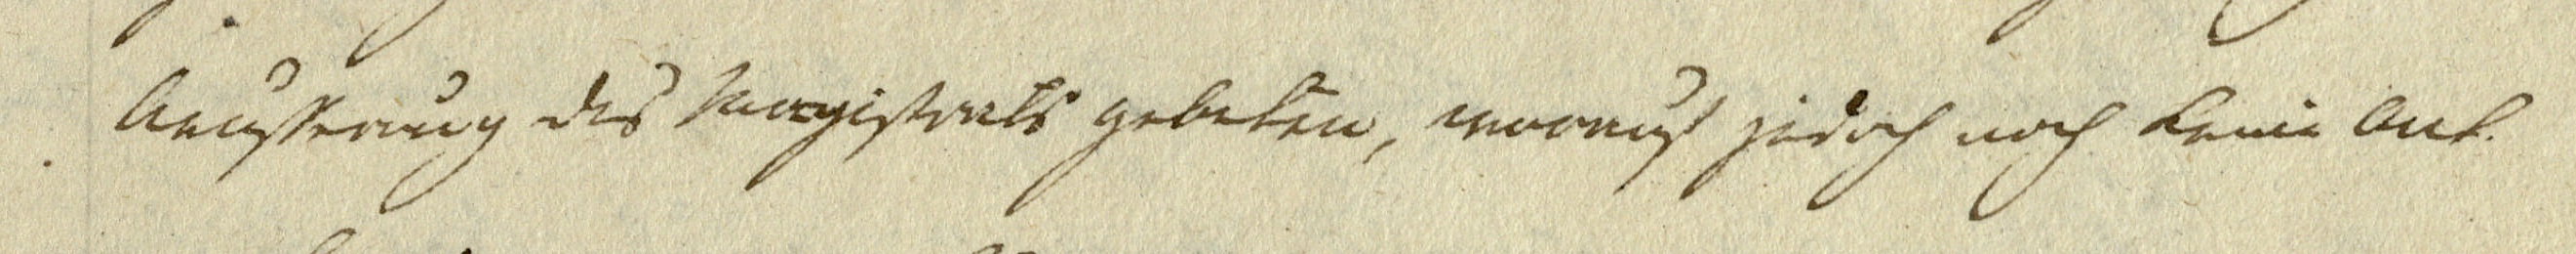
Aeusserung des Magistrats gebethen, worauf jedoch noch keine Ant¬
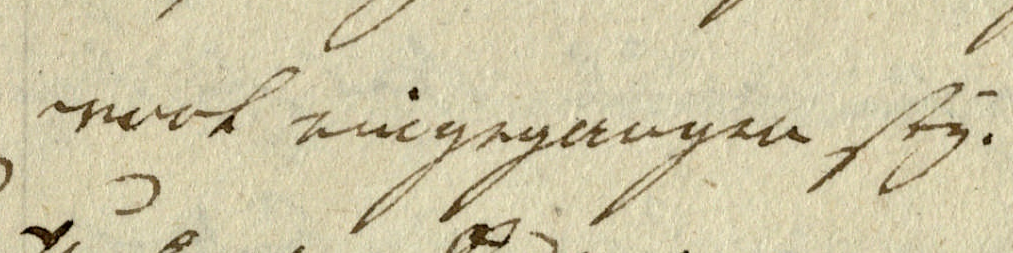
wort eingegangen seÿ.
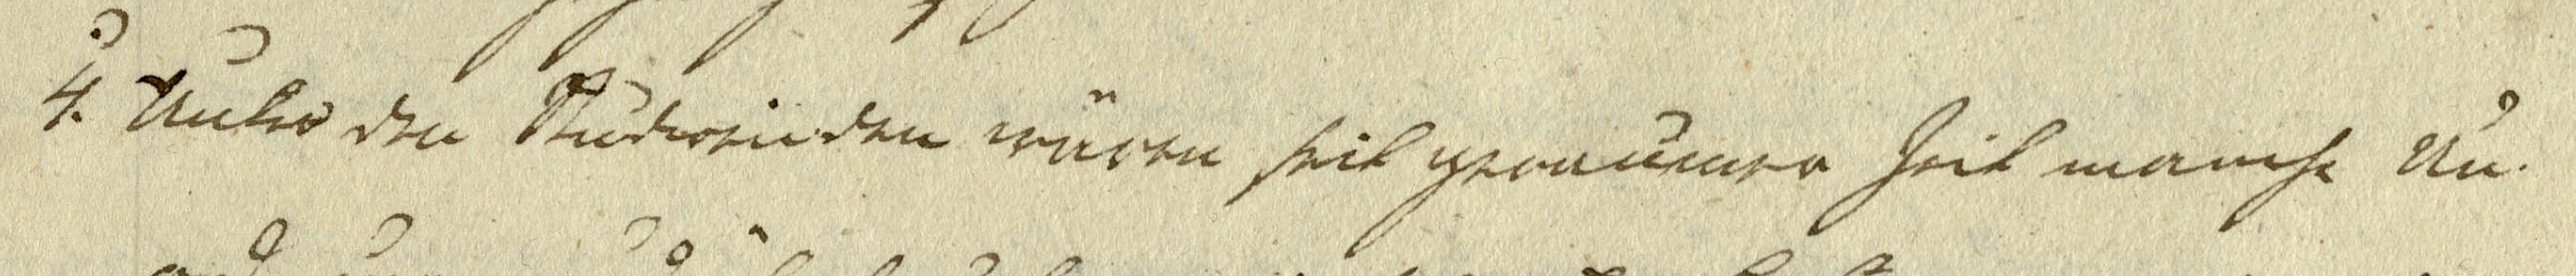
4. Unter den Studirenden wären seit geraumer Zeit manche Un¬
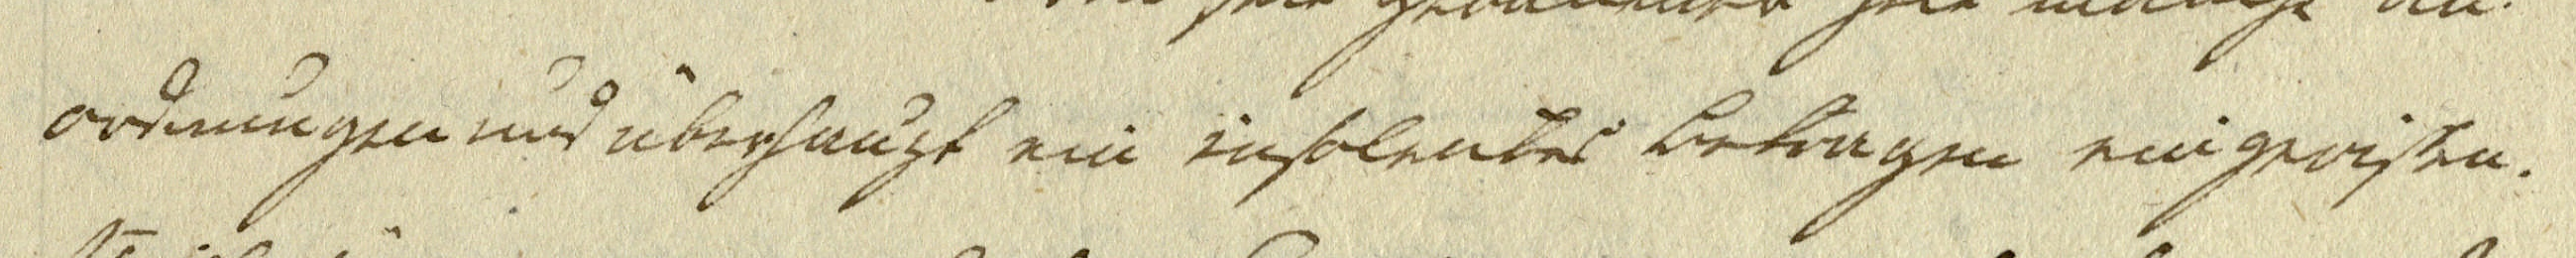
ordnungen und überhaupt ein insolentes Betragen eingerissen.
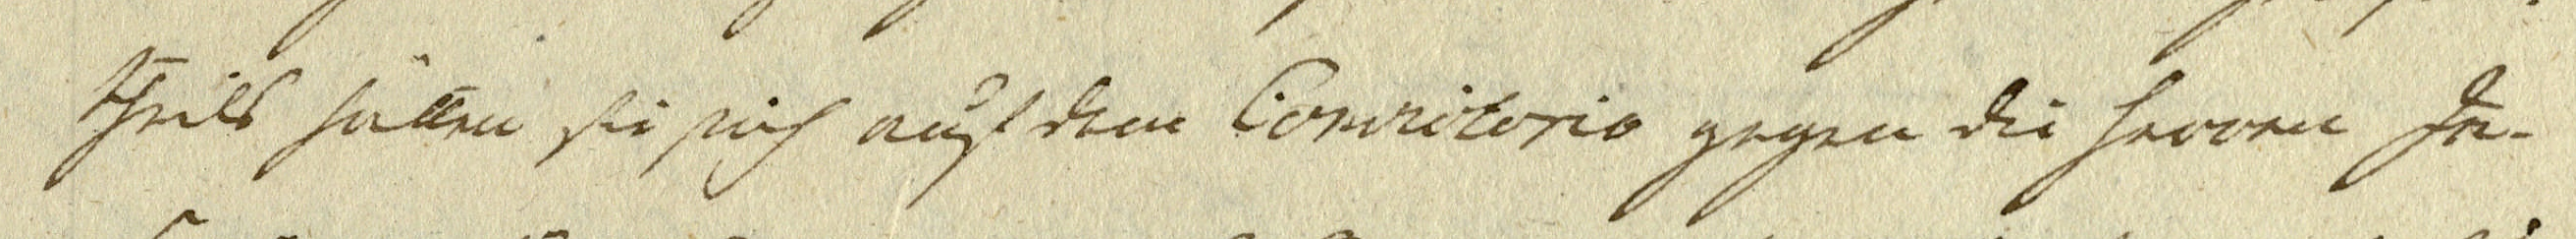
Theils hätten sie sich auf dem Convictorio gegen die Herren In¬
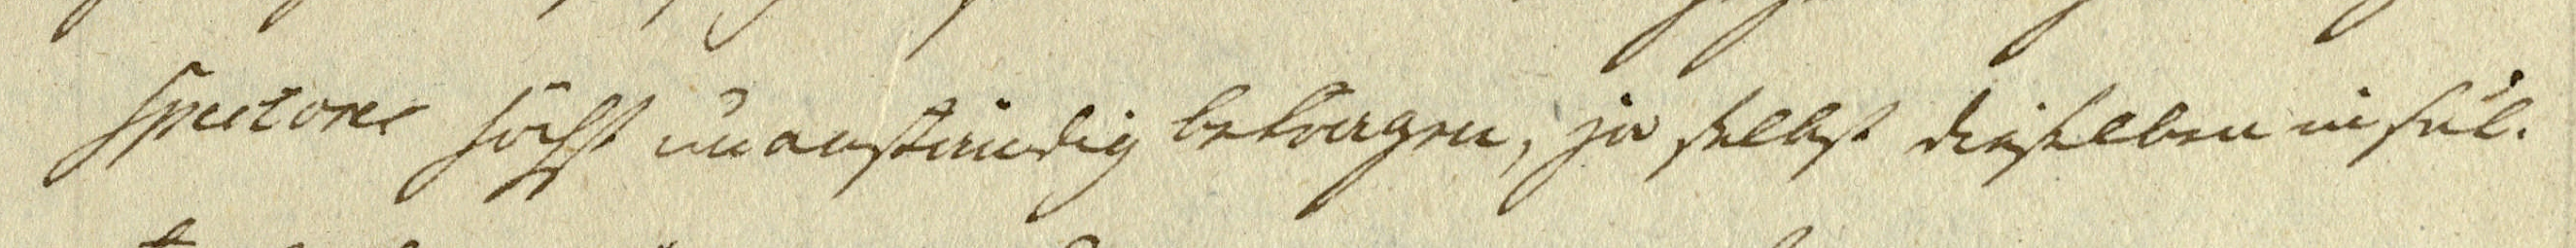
spectores höchst unanständig betragen; ja selbst dieselben insul¬
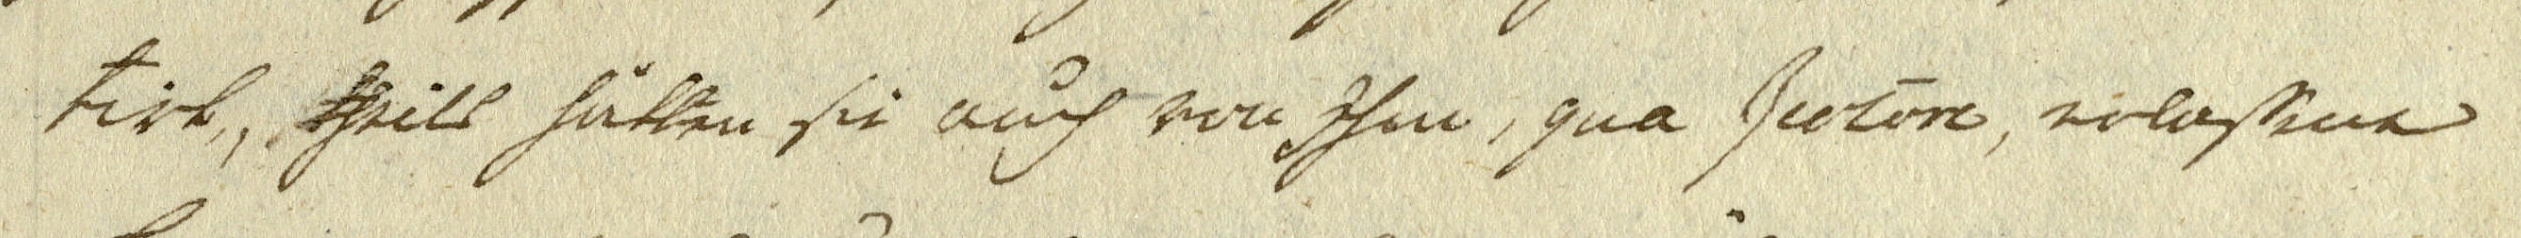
tirt, theils hätten sie auch von ihm, qua Rectore, erlassene
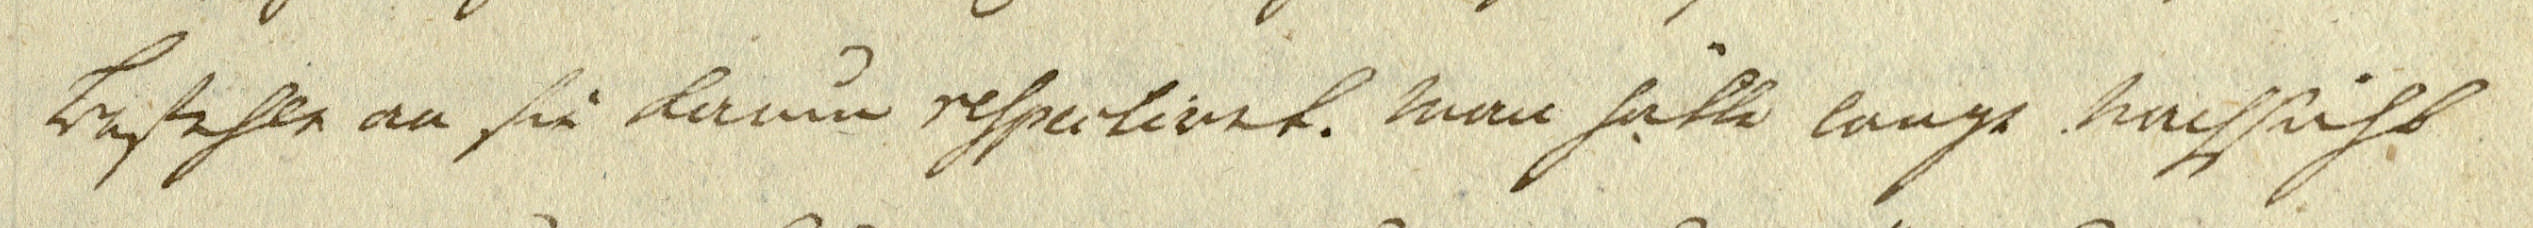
Befehle an sie kaum respectiret. Man hätte lange Nachsicht
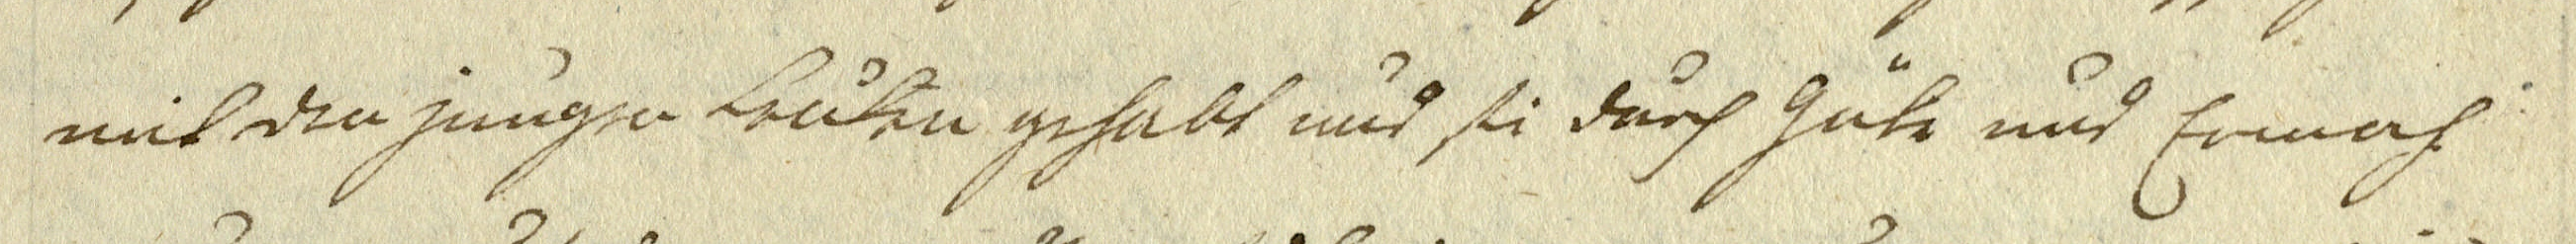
mit den jungen Leuen gehabt und sie durch Güte und Ermah¬
